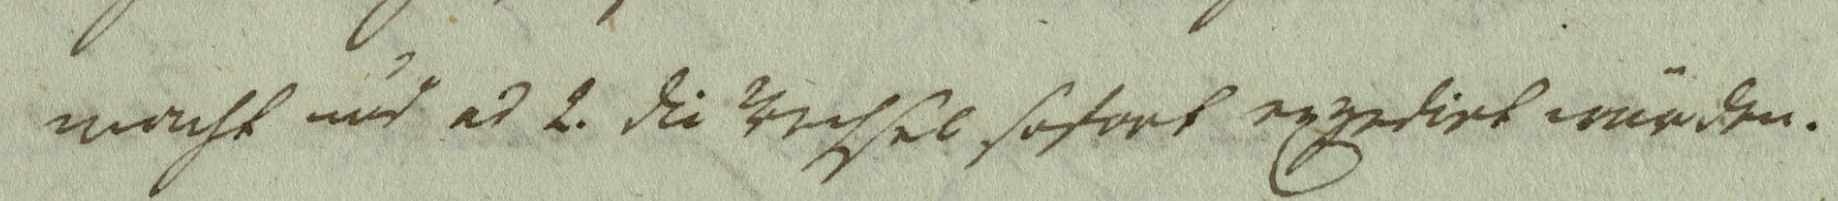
macht und ad 2. die Wechsel sofort expedirt würden.
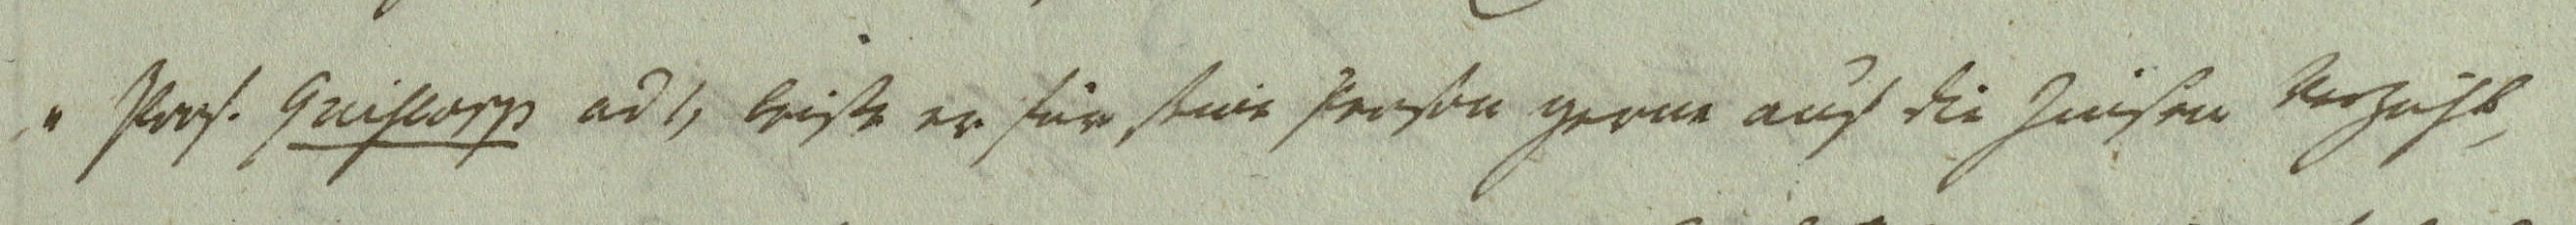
Prof. Quistorp ad 1, leiste er für seine Person gerne auf die Zinsen Verzicht,
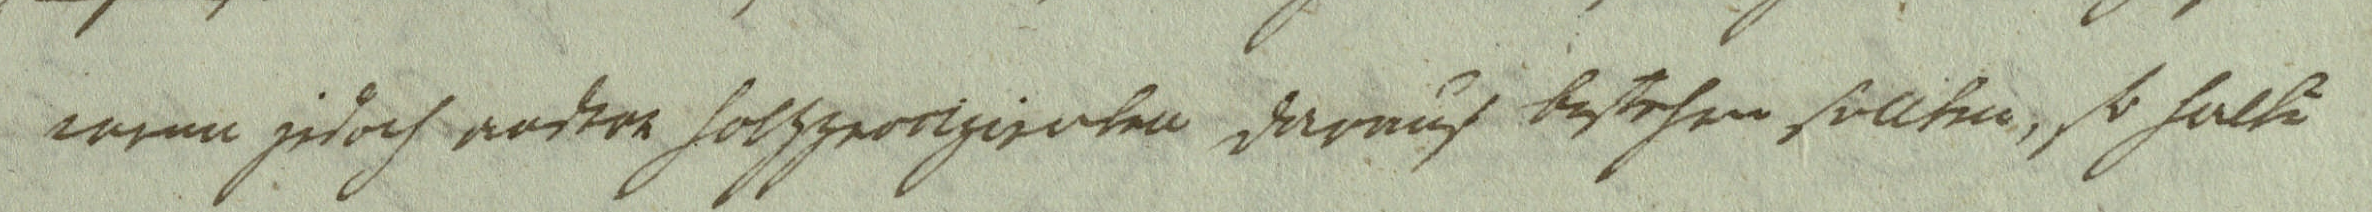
wenn jedoch andere Holzpercipienten darauf bestehen sollten, so halte
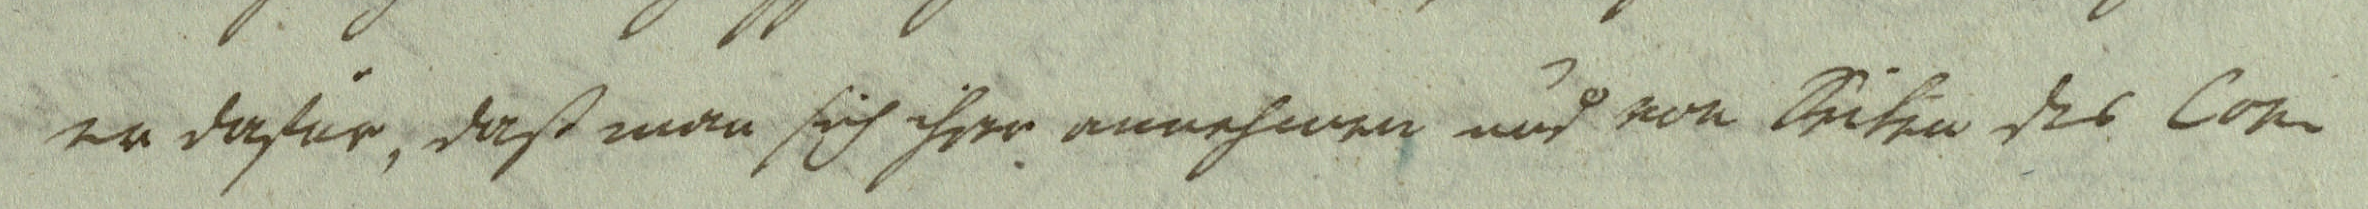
er dafür, daß man sich ihrer annehmen und von Seiten des Con¬
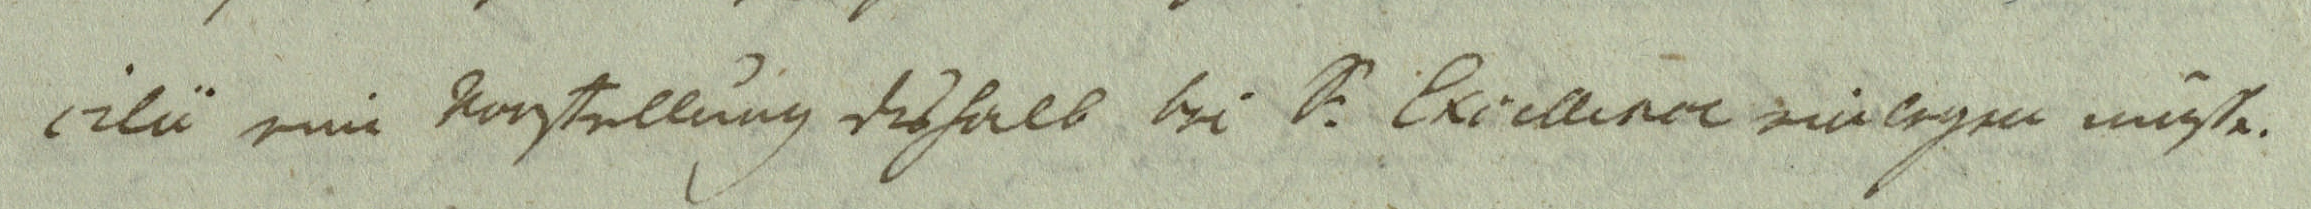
cilii eine Vorstellung deshalb bei Sr. Excellence einlegen müsse.
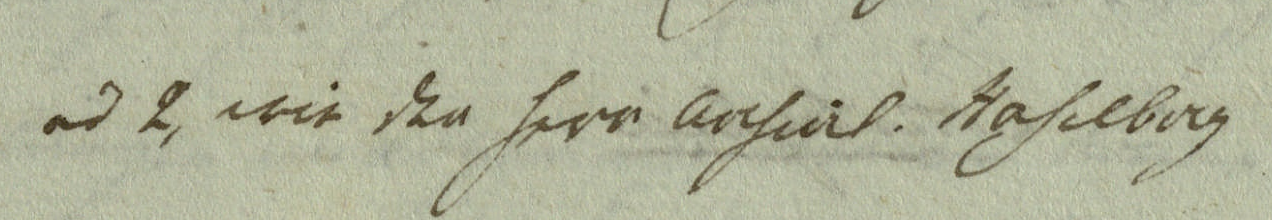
ad 2, wie der herr Archiat. Haselberg
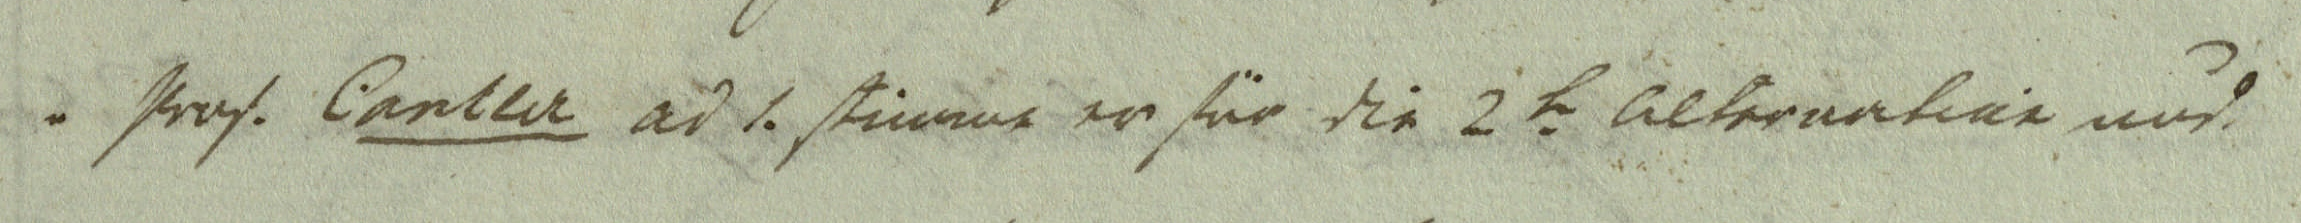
Prof. Canzler ad 1. stimme er für die 2te Alternative und
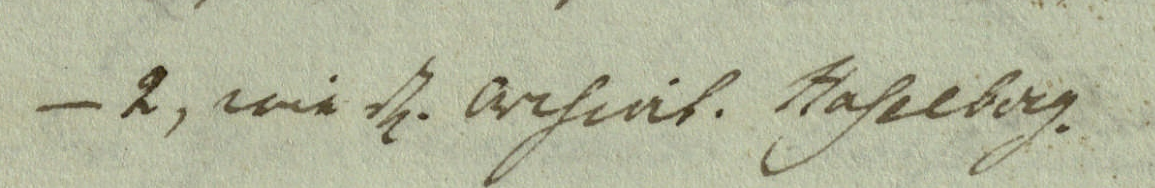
2, wie dh. Archiat. Haselberg.
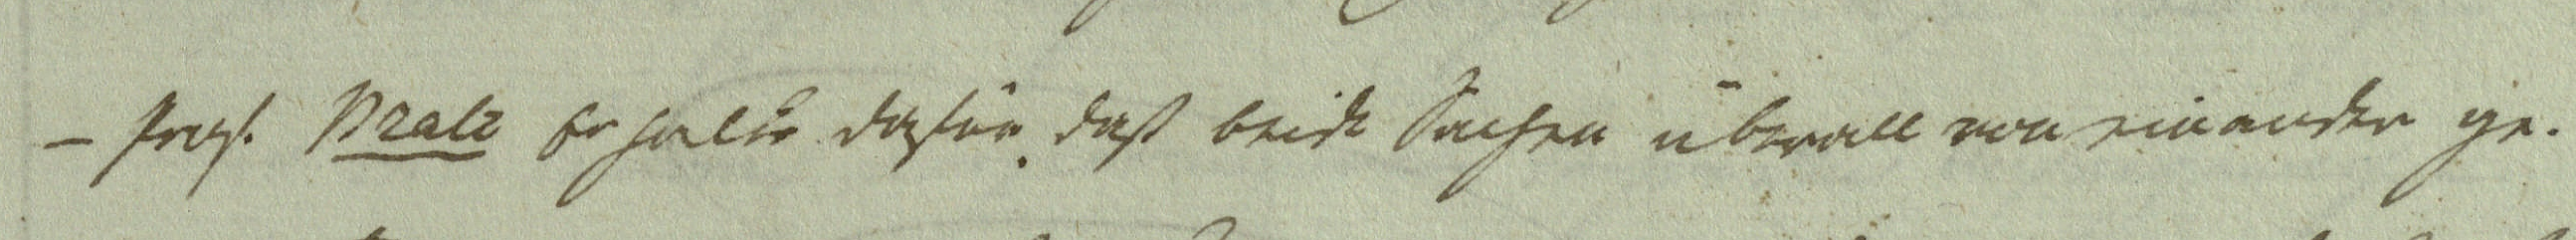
Prof. Bratt er halte dafür, daß beide Sachen überall von einander ge¬
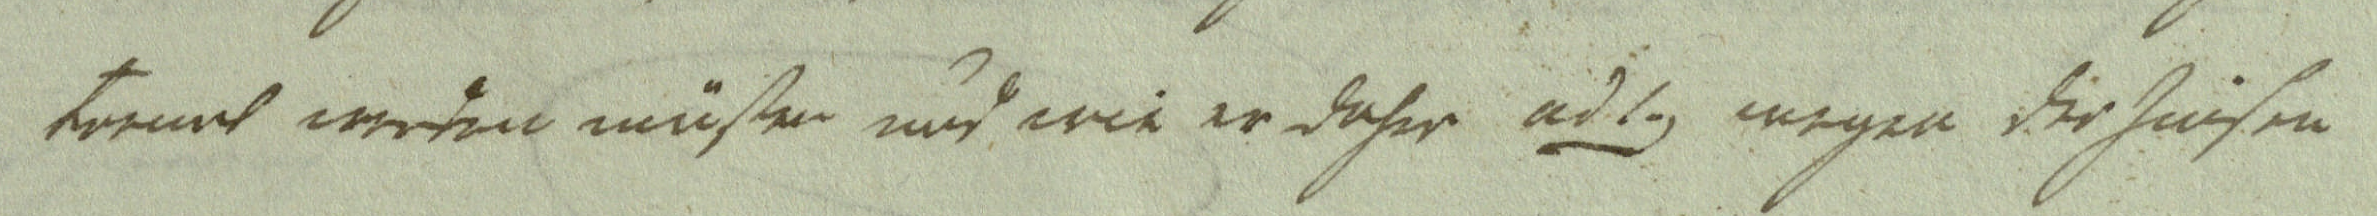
trennt werden müßten und wie er daher ad1. wegen der Zinsen
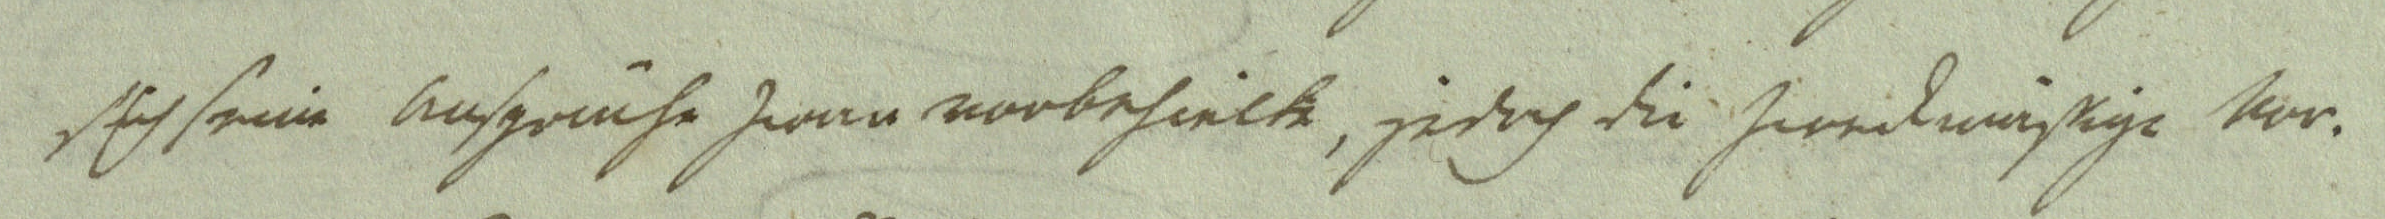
sich seine Ansprüche zwar vorbehielte, jedoch die zweckmässige Vor¬
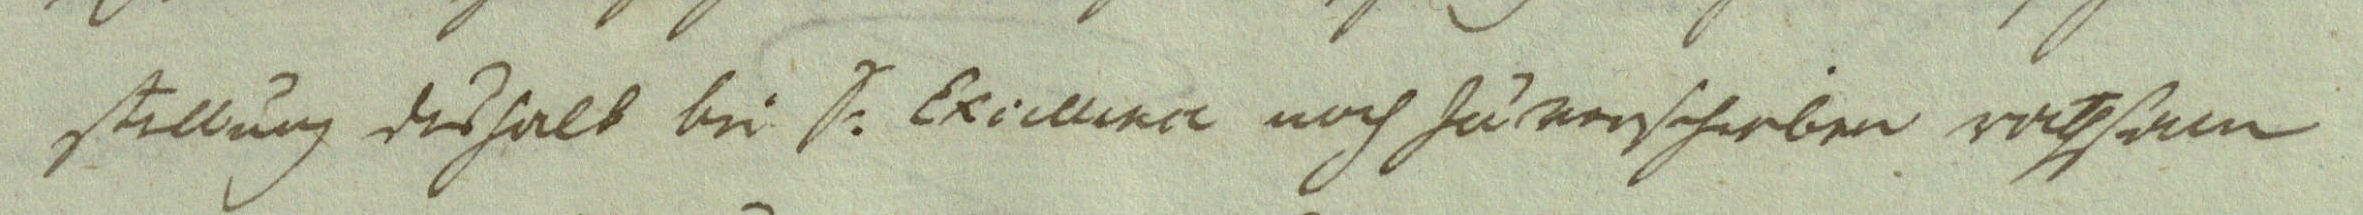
stellung deshalb bei Sr. Excellence noch zu verschieben rathsam
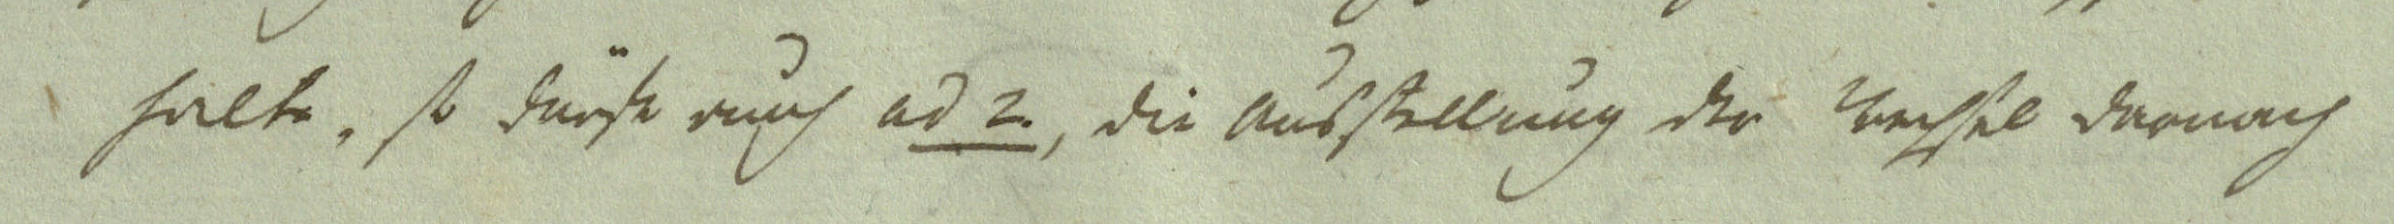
halte, so dürfe auch ad 2, die Ausstellung der Wechsel darnach
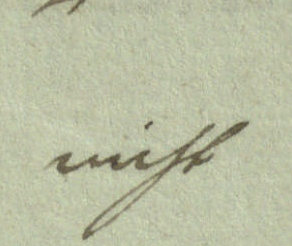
nicht
